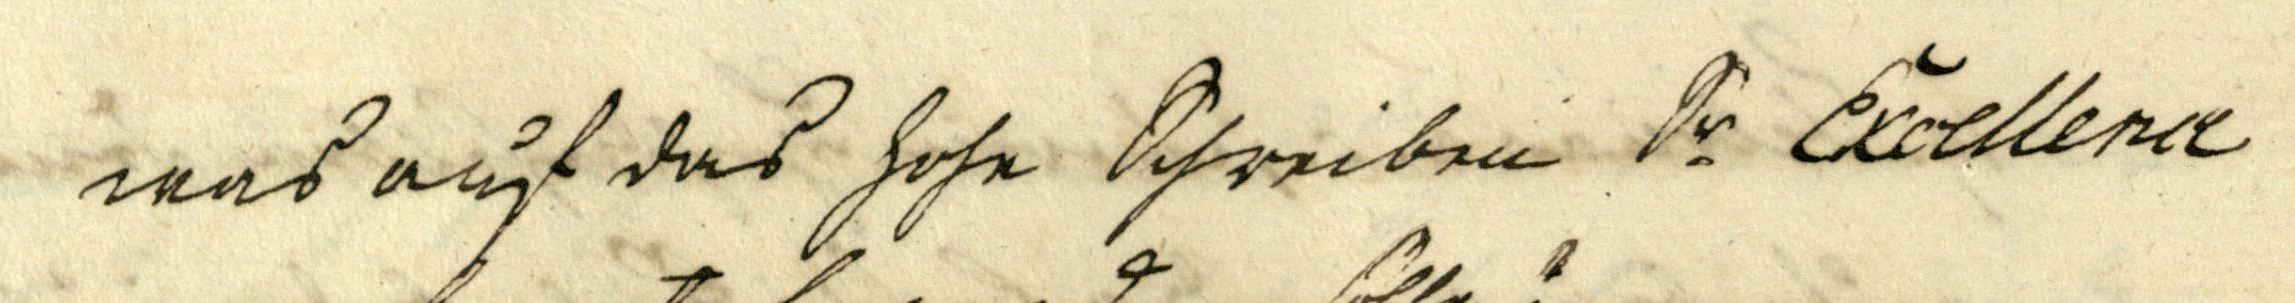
was auf das hohe Schreiben Sr Excellence
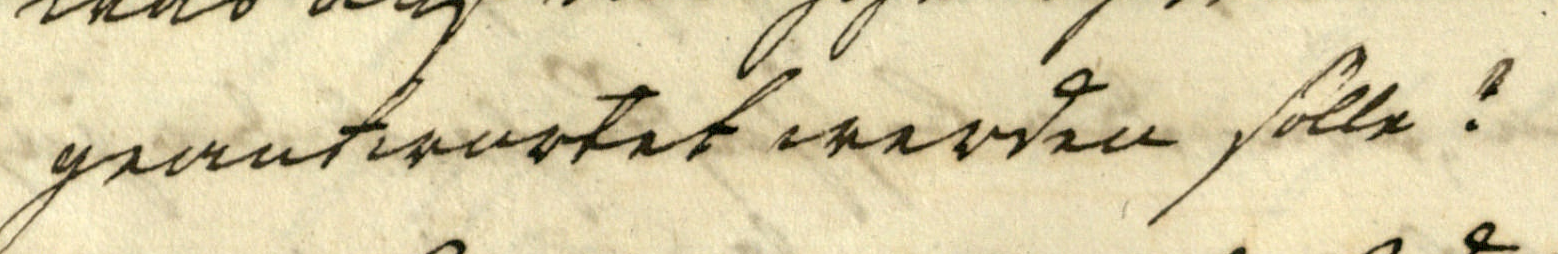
geantwortet werden solle?
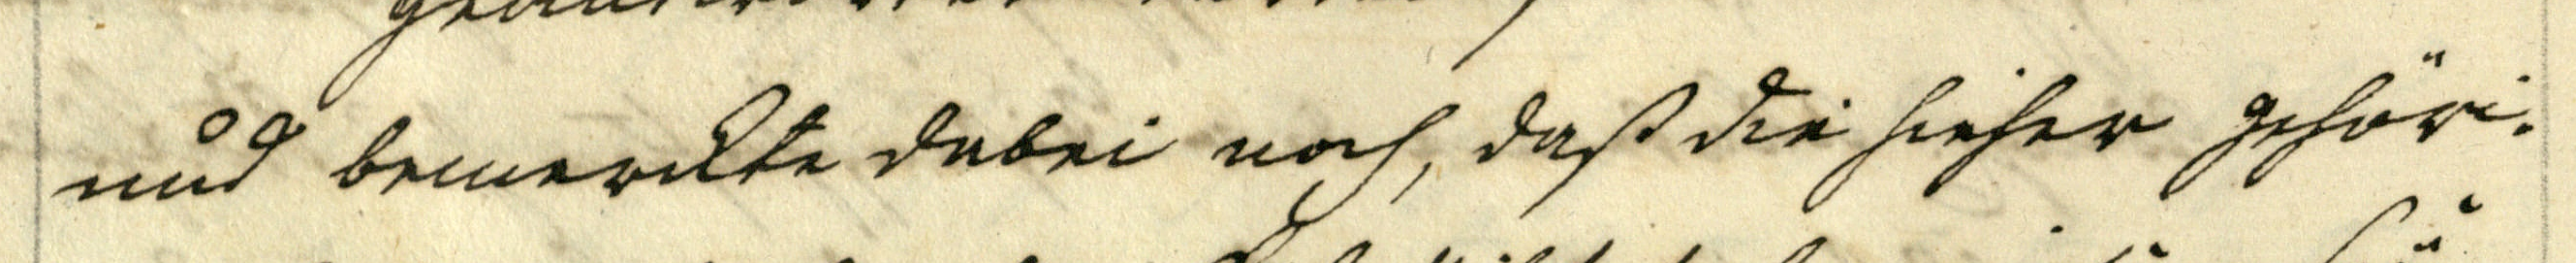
und bemerckte dabei noch, daß die hieher gehöri¬
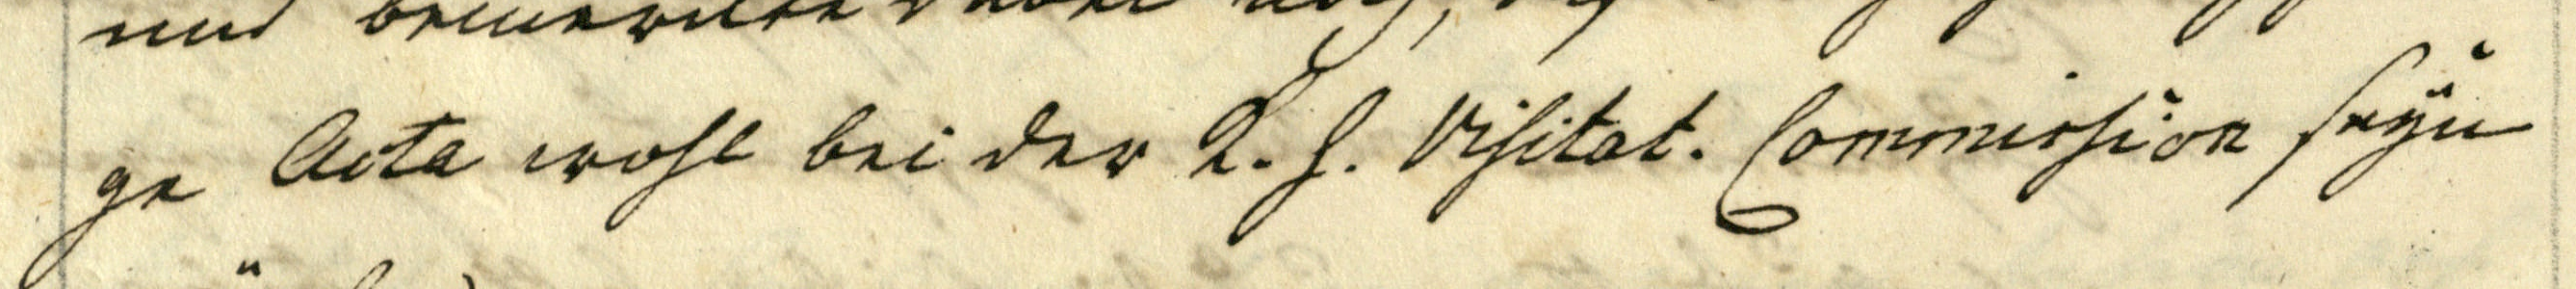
ge Acta wohl bei der K. H. Visitat. Commission seÿn
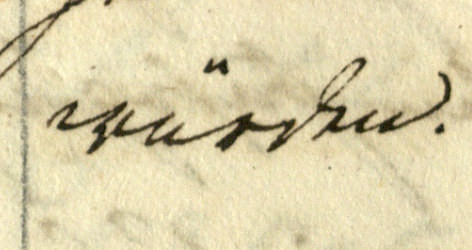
würden.
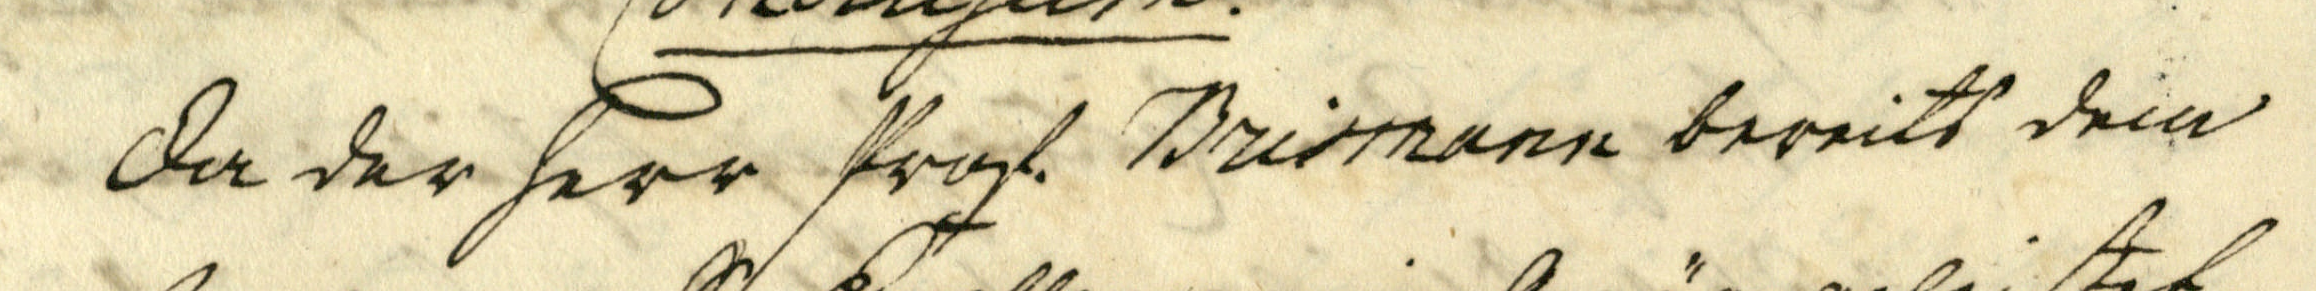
Da der Herr Prof. Brismann bereits dem
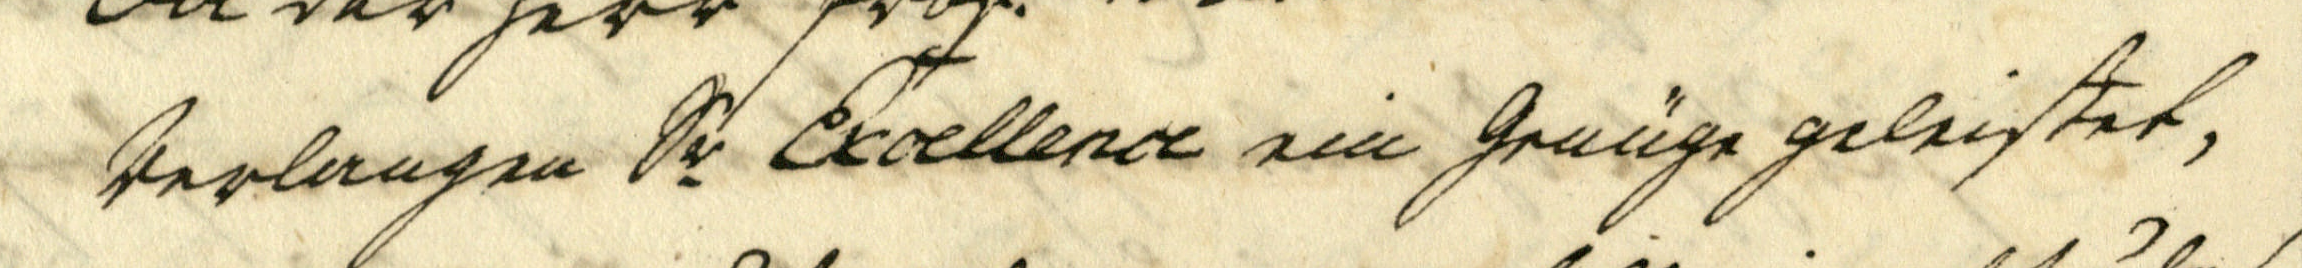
Verlangen Sr. Excellence ein Genüge geleistet,
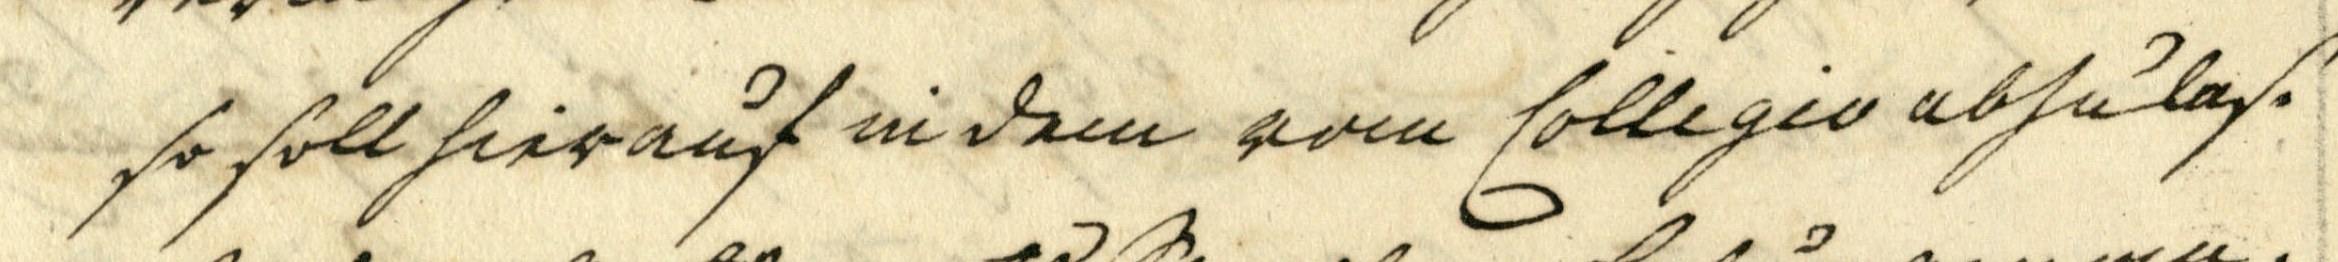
so soll hierauf in dem vom Collegio abzulas¬
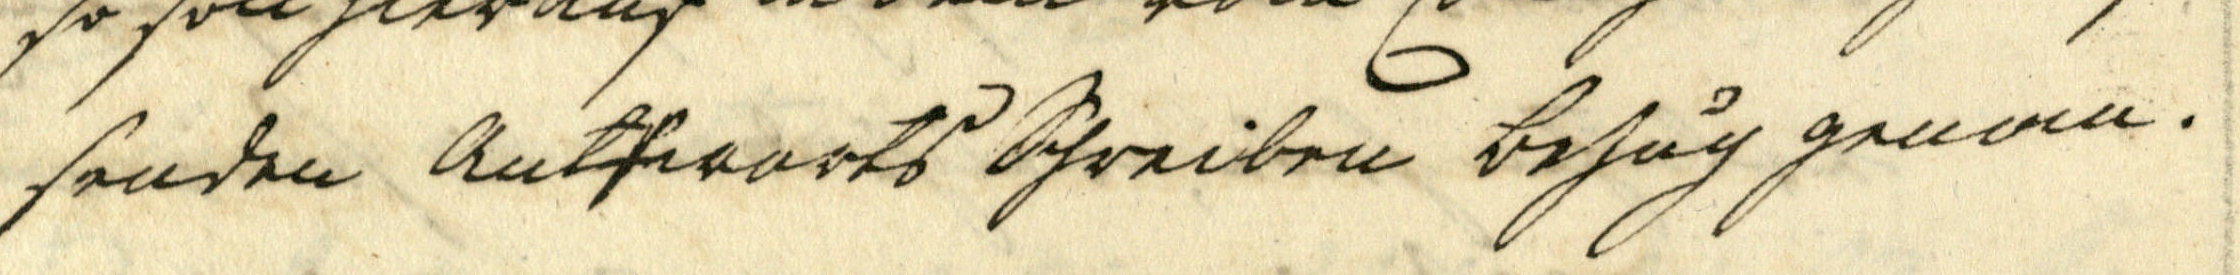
senden Antsworts Schreiben Bezug genom¬
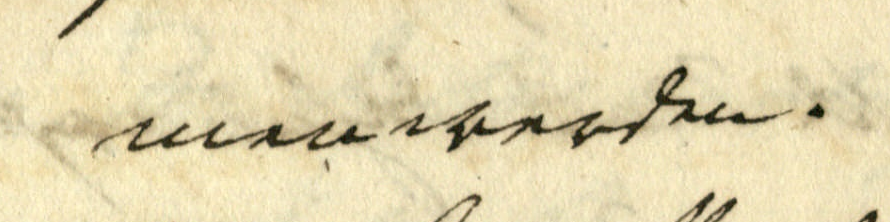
men werden.
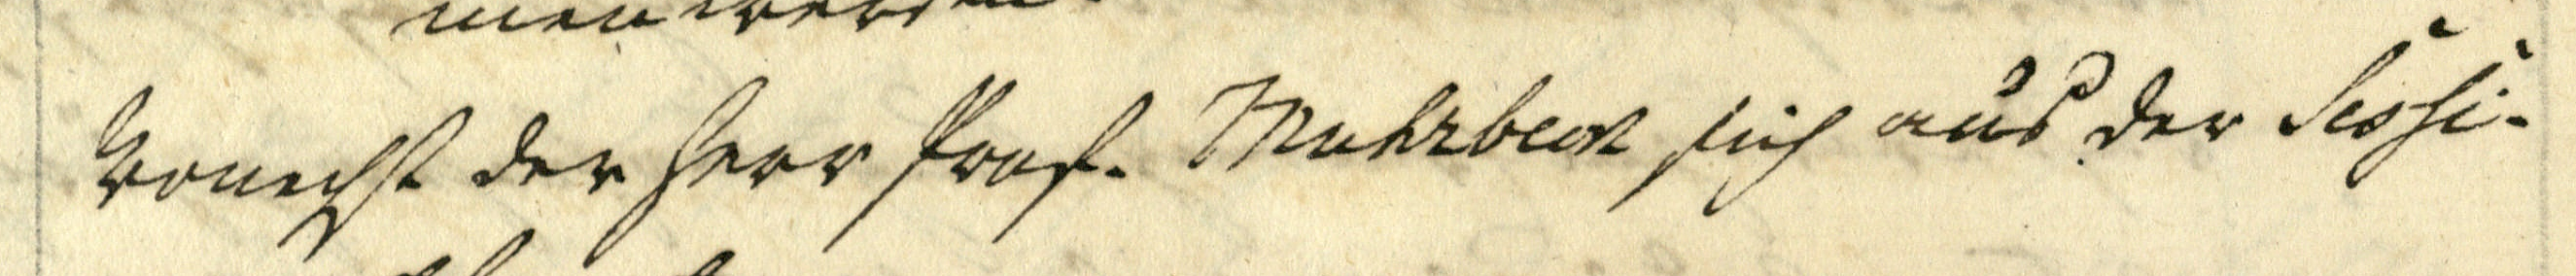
Wonechst der Herr Prof. Muhrbeck sich aus der Sessi¬
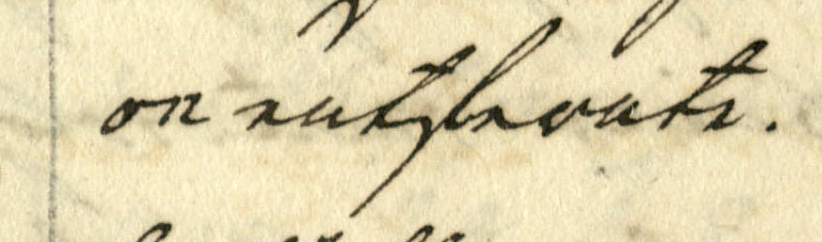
on entfernte.
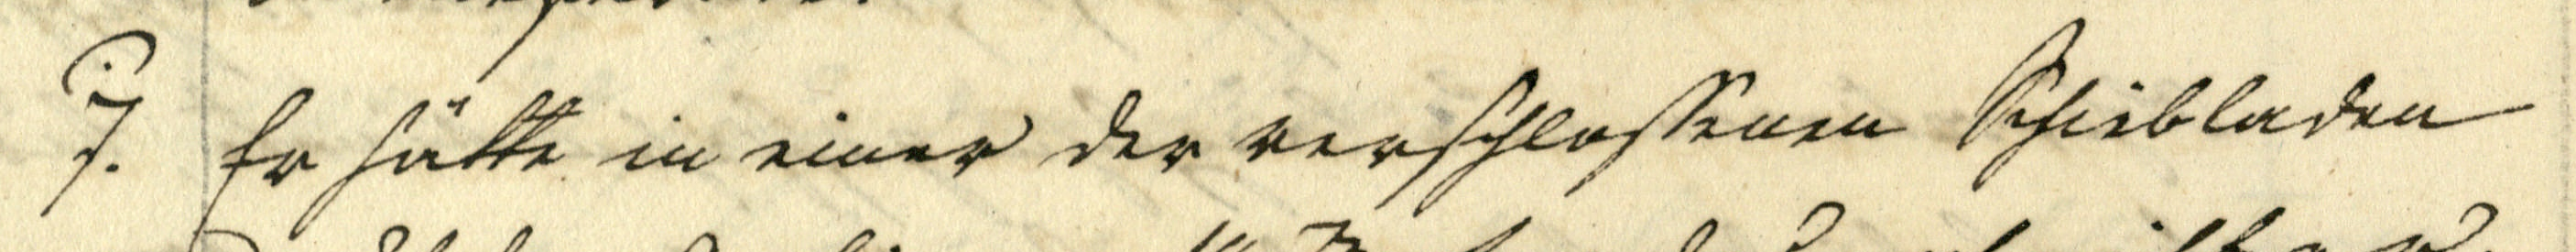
7. Er hätte in einer der verschlossenen Schiebladen
